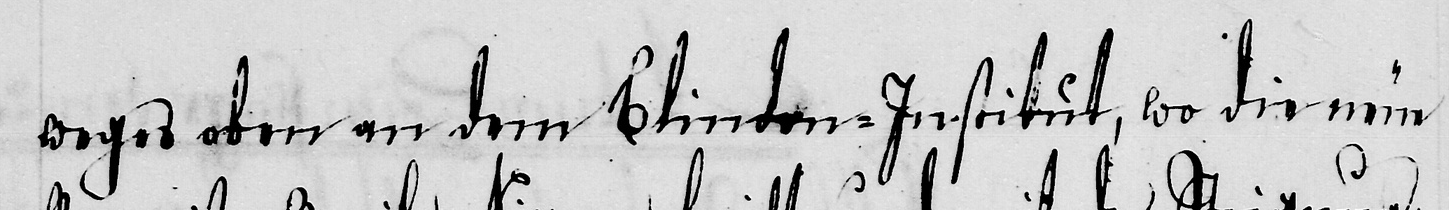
weges oben an dem Blinden-Institut, wo die neue
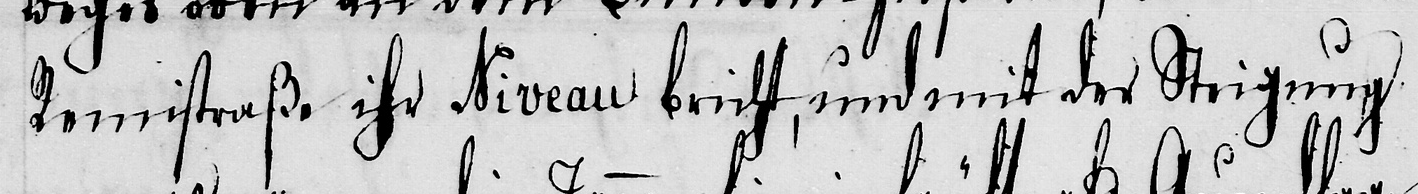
Remistraße ihr Niveau bricht, und mit der Steigung
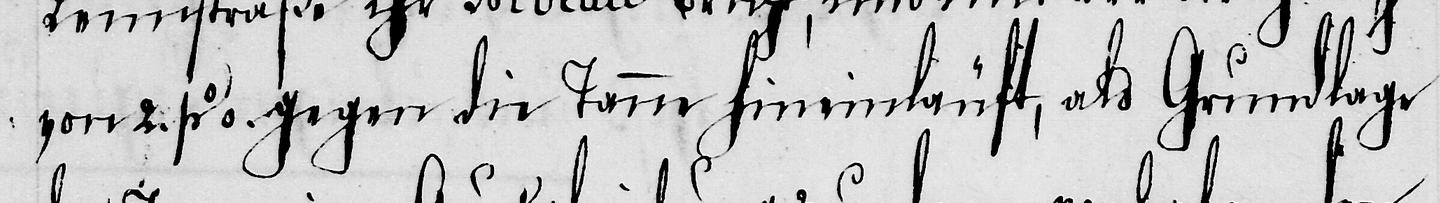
von 2. % gegen die Tanne hineinläuft, als Grundlage
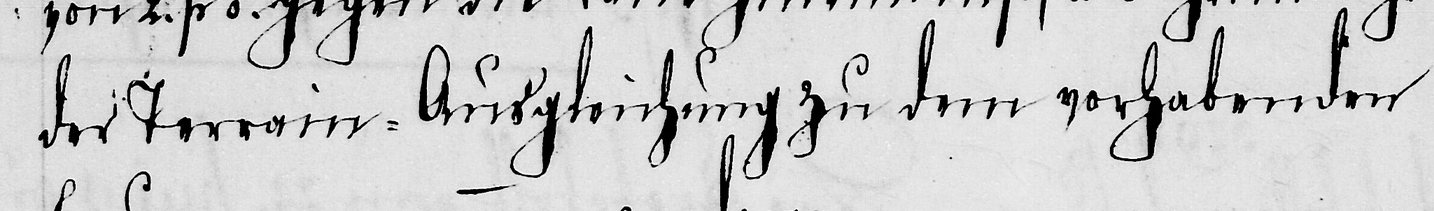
der Terrain-Ausgleichung zu dem vorhabenden
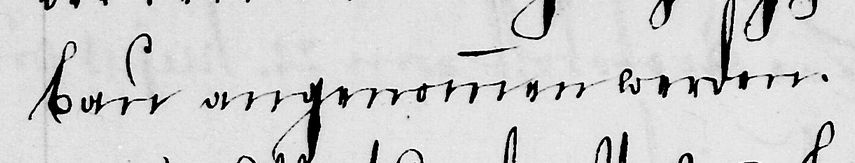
Bau angenommen werden.
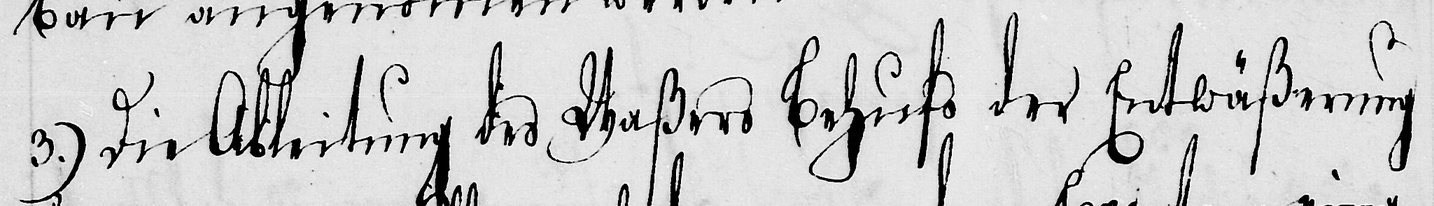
3.) Die Ableitung des Waßers Behufs der Entwäßerung
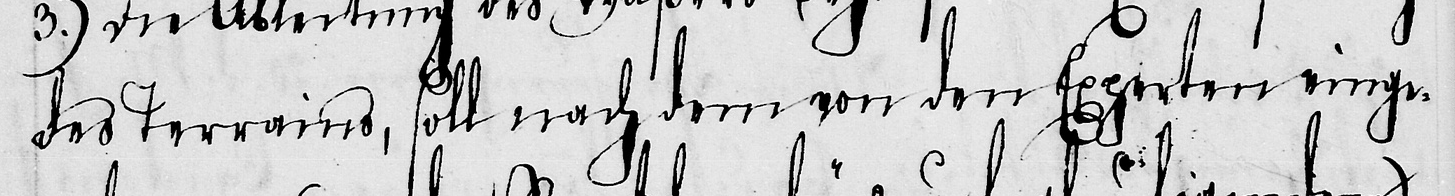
des Terrains, soll nach dem von den Experten einge¬
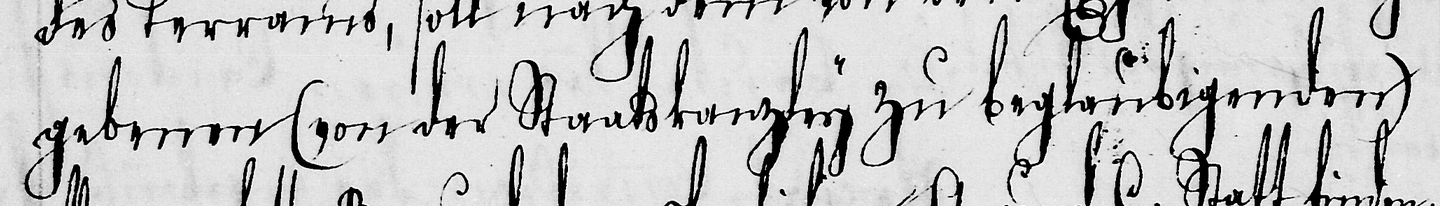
gebenen (von der Staatskanzley zu beglaubigenden)
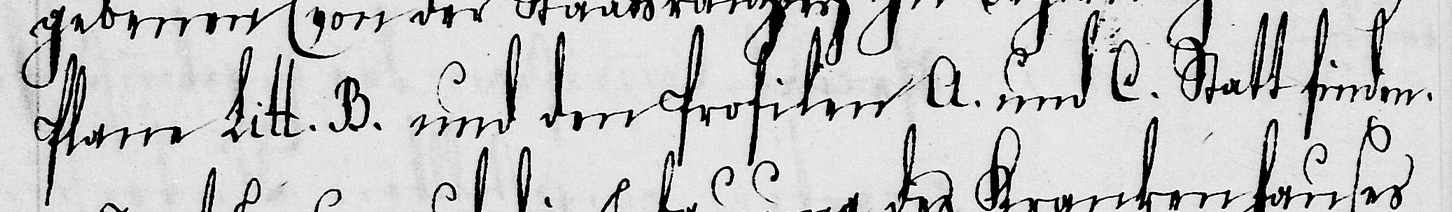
Plane Litt. B. und den Profilen A. und C. Statt find¬
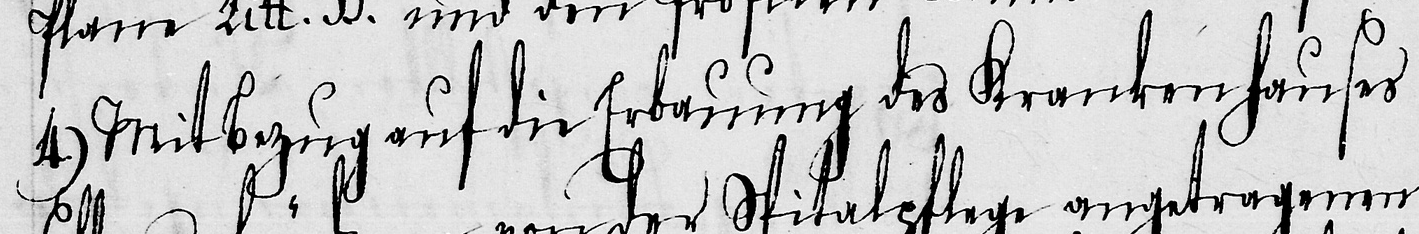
4.) Mit Bezug auf die Erbauung des Krankenhauses
